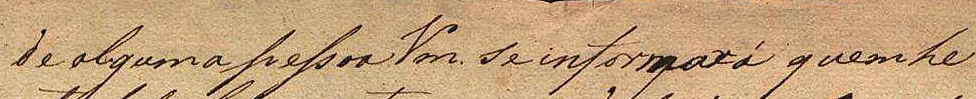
de alguma pessoa Vm. se informará quem he
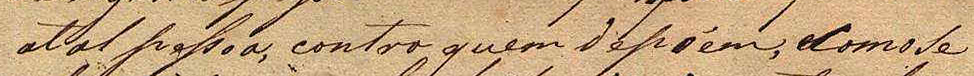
a tal pessoa, contra quem depoẽm, e como se
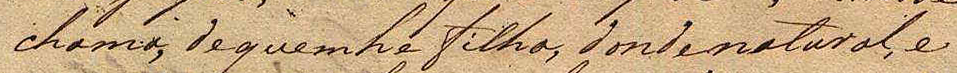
chama, de quem he filha, donde natural, e
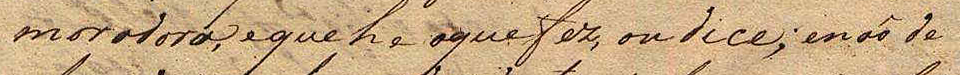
moradora, e que he o que fez, ou dice; e naõ de
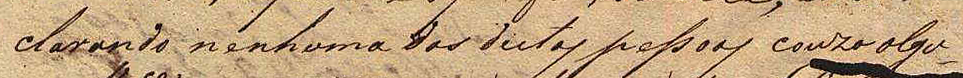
clarando nenhuma das dictas pessoas couza algu
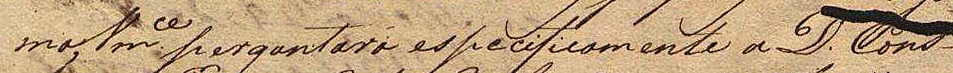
ma Vm.ce perguntará especificamente a D. Cons
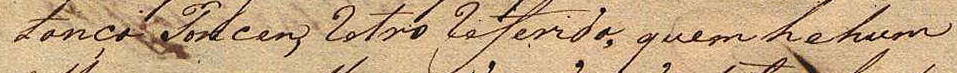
tança Toncen, Retro Referida, quem he hum
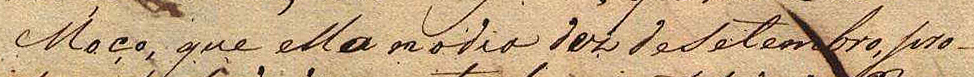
Moço, que ella no dia dez de Setembro, pro
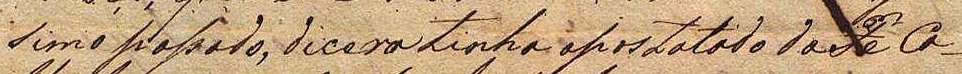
simo passado, dicera tinha apostatado da Fé Ca
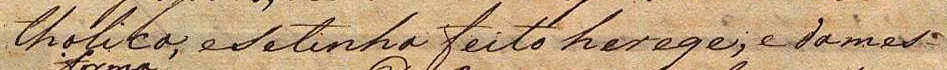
tholica, e se tinha feito herege; e da mes
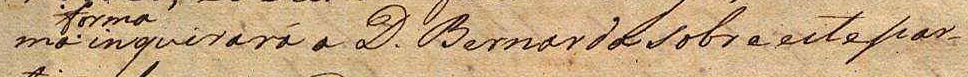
ma forma inquirará a D. Bernarda sobre este par
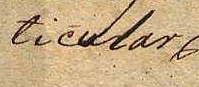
ticular
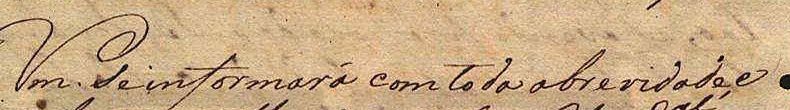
Vm. se informará com toda a brevidade, e
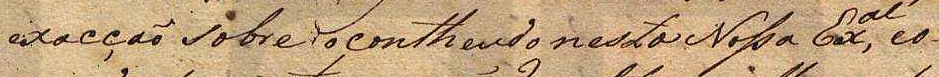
exacçaõ sobre o contheudo nesta Nossa Ex.al, e o
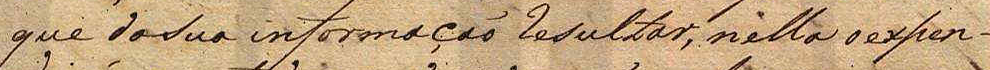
que da sua informaçaõ Resultar, nella o expen
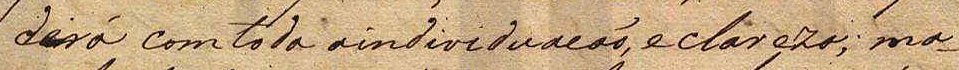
derá com toda a individuaçaõ, e clareza; ma
